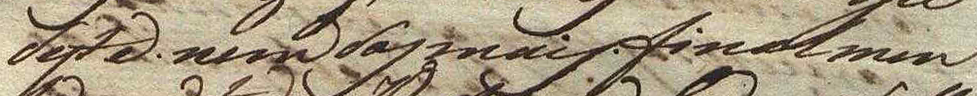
deste; nem dos mais. finalmen
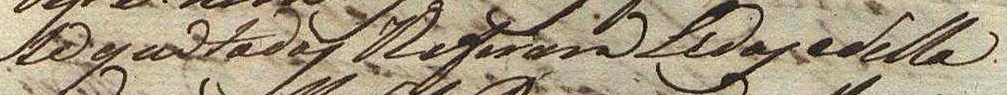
te que todos lhe foram Lidos e della.
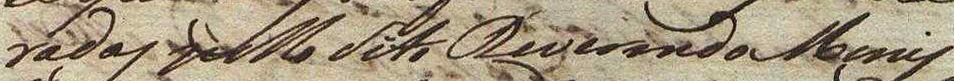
rados pello dito Reverendo Menis
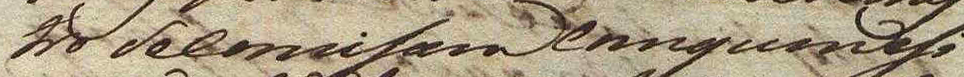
tro de comissam com quem asi
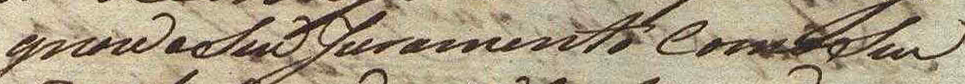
gnou o Seu Juramento com o Seu
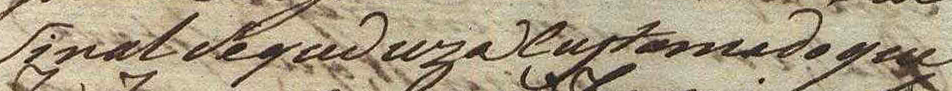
sinal de que uza custumado que
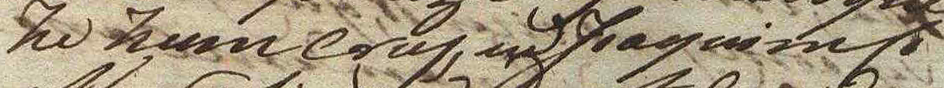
he hum crus, eu Joaquim Co
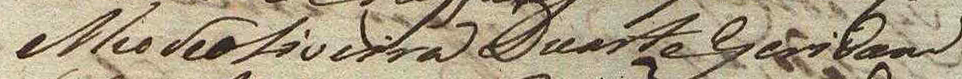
elho de oliveira Duarte Escrivam
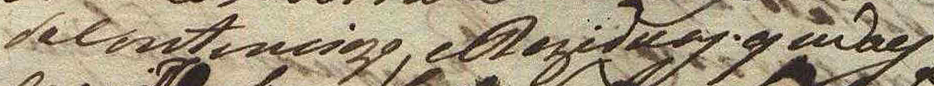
do contenciozo, e Reziduos. que o es
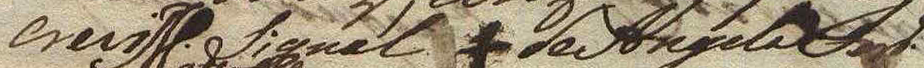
crevi Signal + de Angela Ferr.a
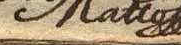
Mateo
